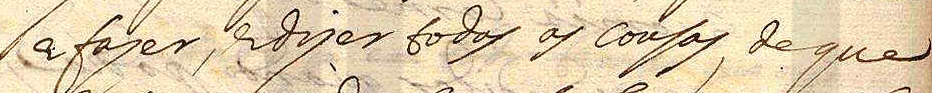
E fazer, E dizer todas as cousas de que
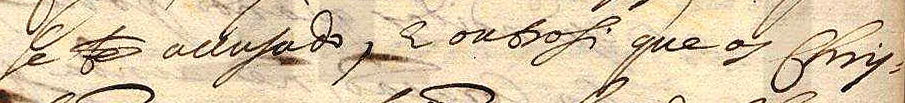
se tē accusado, E outrosi que os Chris
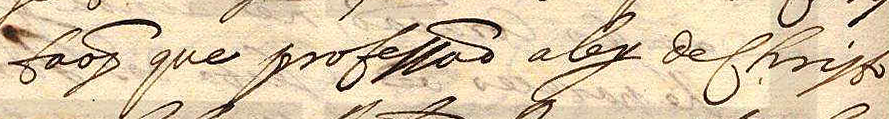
taõs que professão a ley de Christo
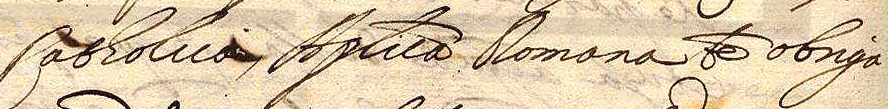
Catholica, Apl̄ica Romana tē obriga
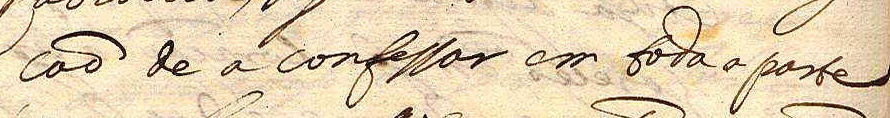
çaõ de a confessar em toda a parte
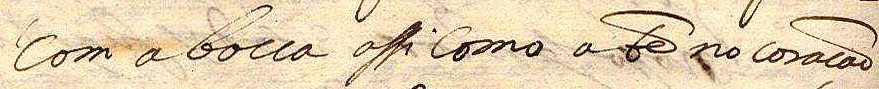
com a boca assi como a tē no coraçaõ
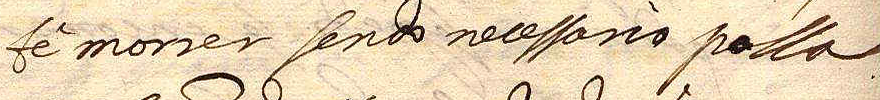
té morrer sendo necessario polla
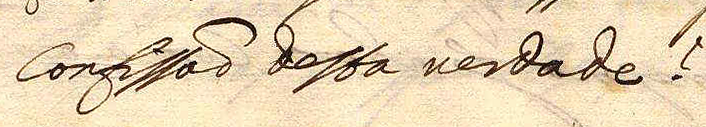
confissão desta uerdade?
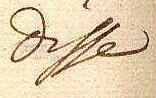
Disse
